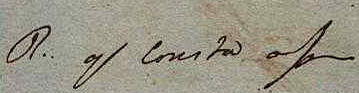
R. q̄ consta a f__.
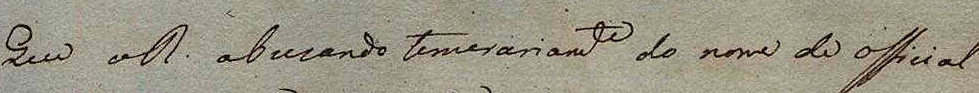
Que o R. abuzando temerariam.te do nome de official
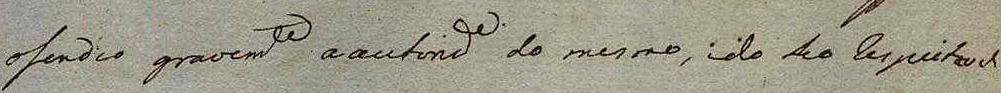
ofendeo gravem.te a autorid.e do mesmo, e do seo Respeitavel
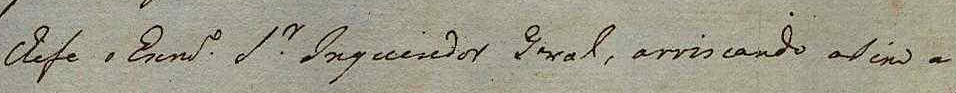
chefe o Exm.o S.r Inquisidor Geral, arriscando asim a
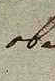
obe
